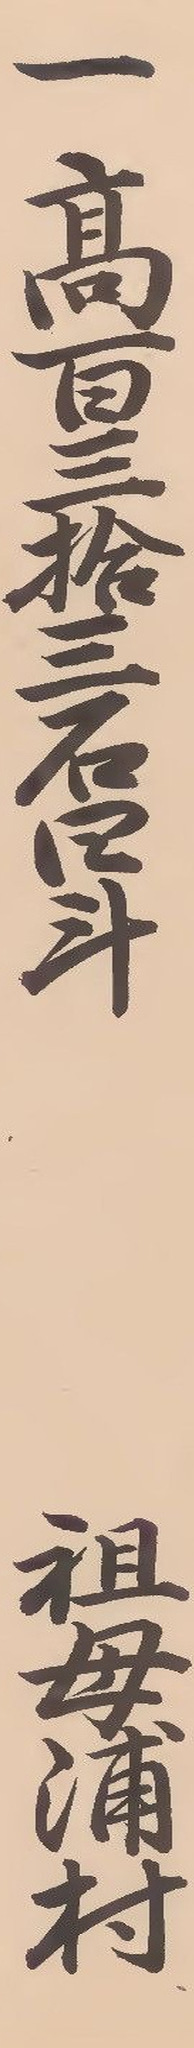一高百三拾三石四斗祖母浦村
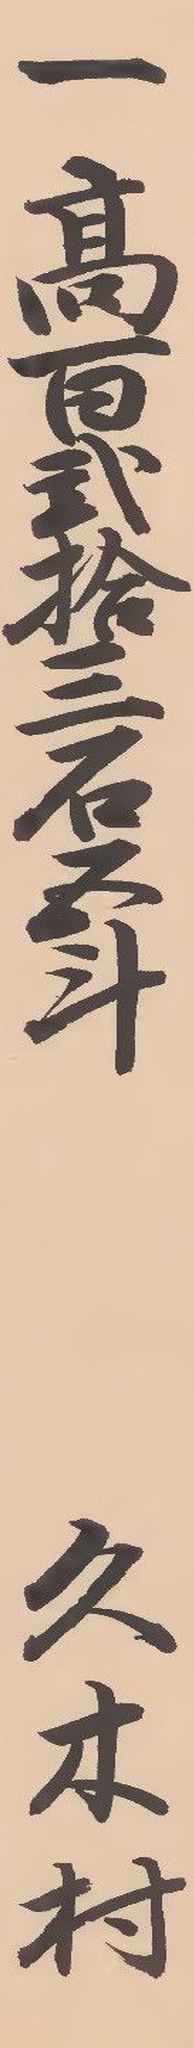一高百弐拾三石五斗久木村

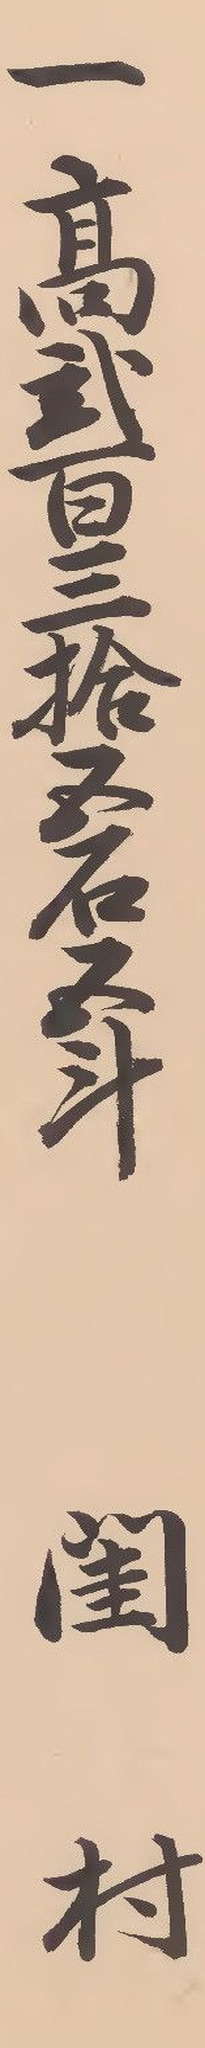一高弐百三拾五石五斗閨村
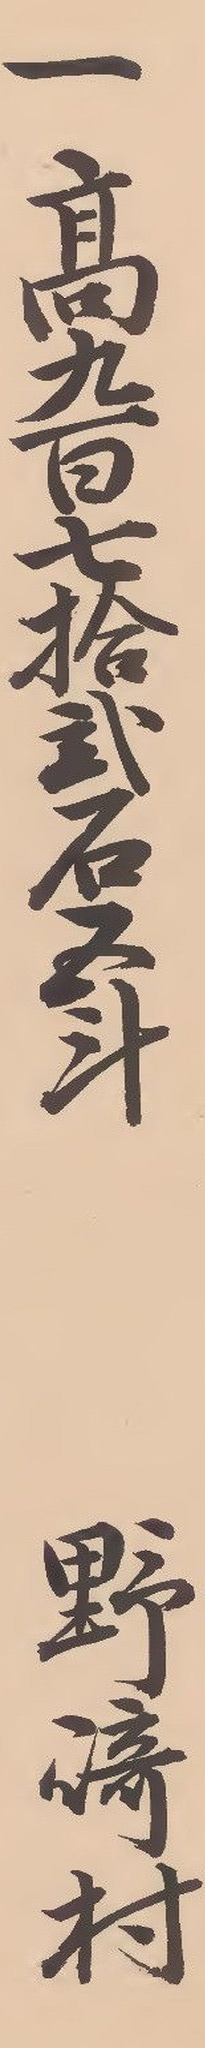一高九百七拾弐石五斗野崎村
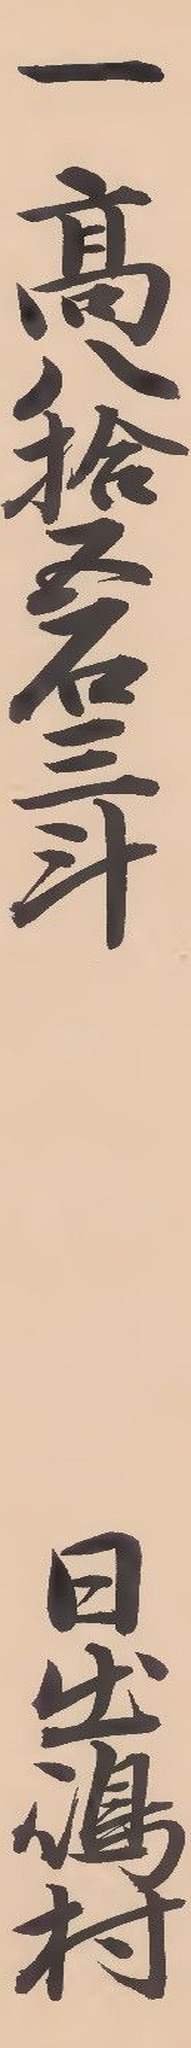一高八拾五石三斗日出島村
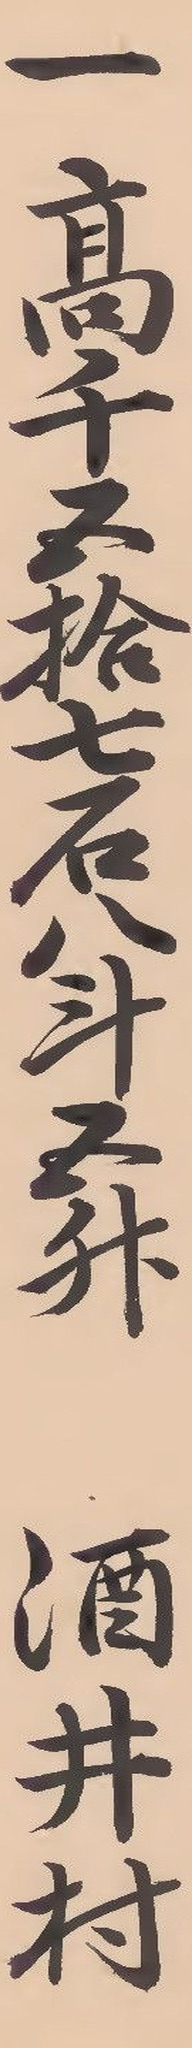一高千五拾七石八斗五升酒井村

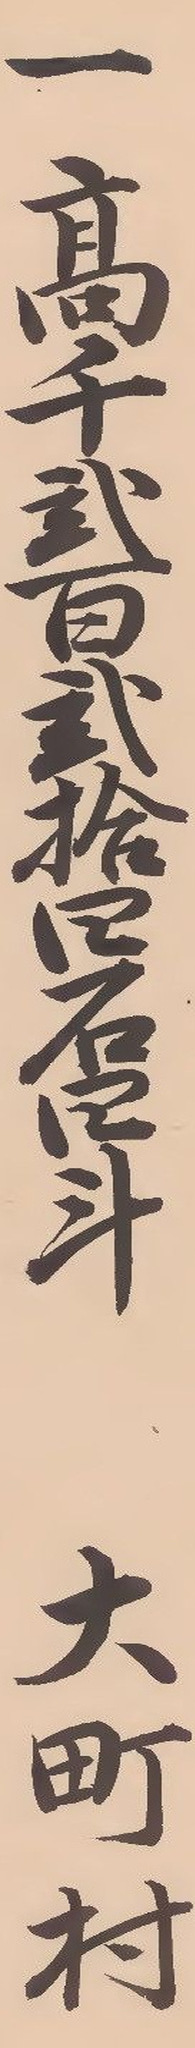一高千弐百弐拾四石四斗大町村
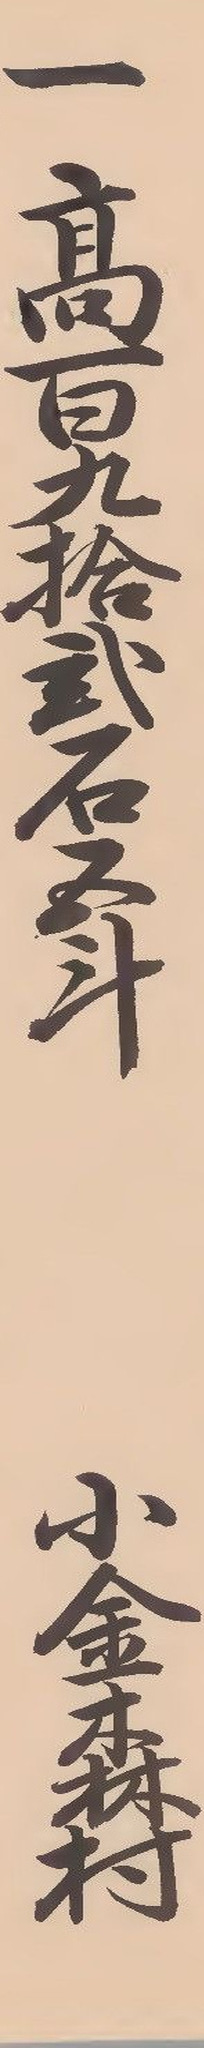一高百九拾弐石五斗小金森村
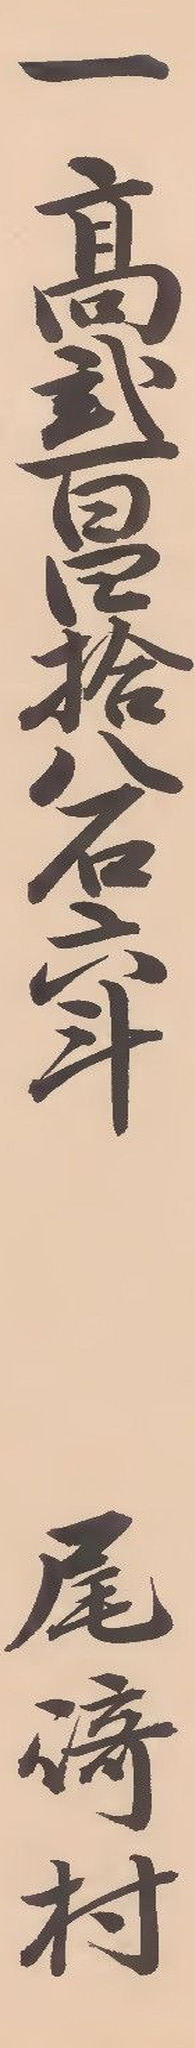一高弐百四拾八石六斗尾崎村

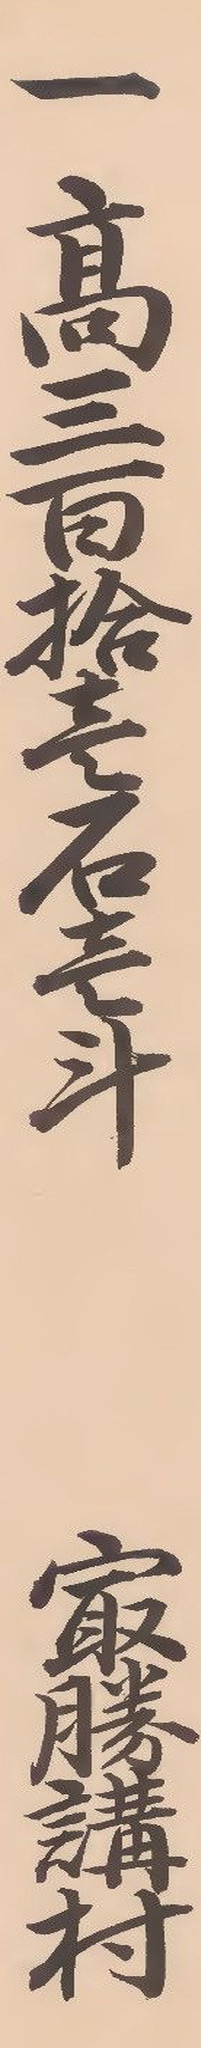一高三百拾壱石壱斗最勝講村
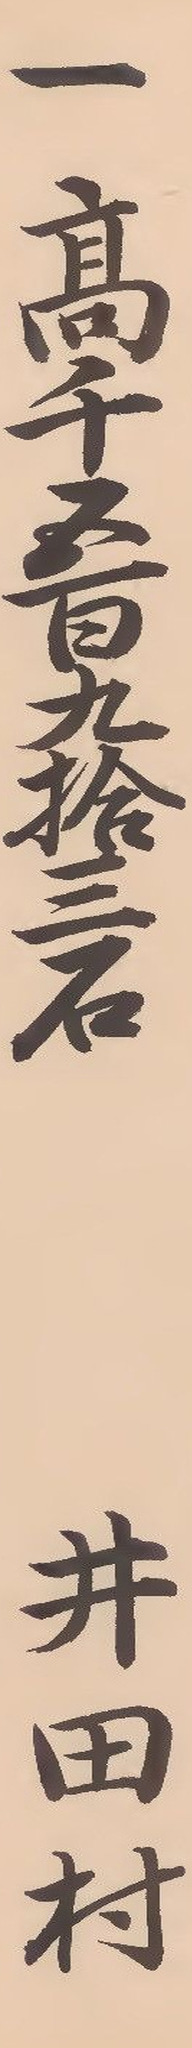一高千五百九拾三石井田村
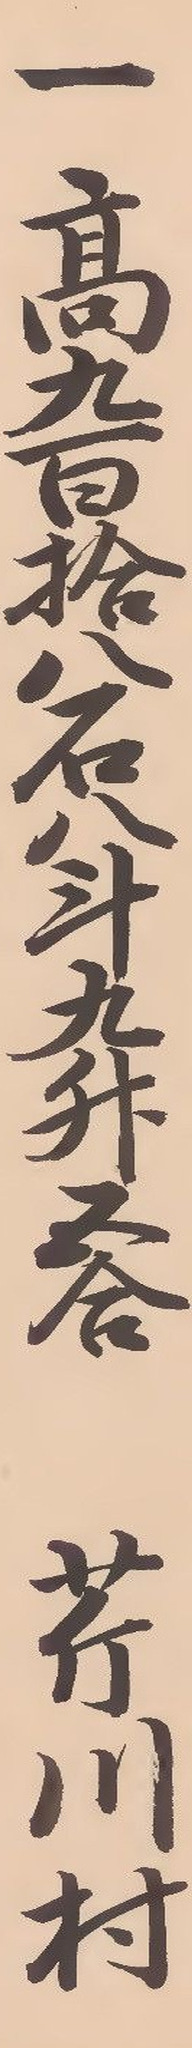一高九百拾八石八斗九升五合芹川村
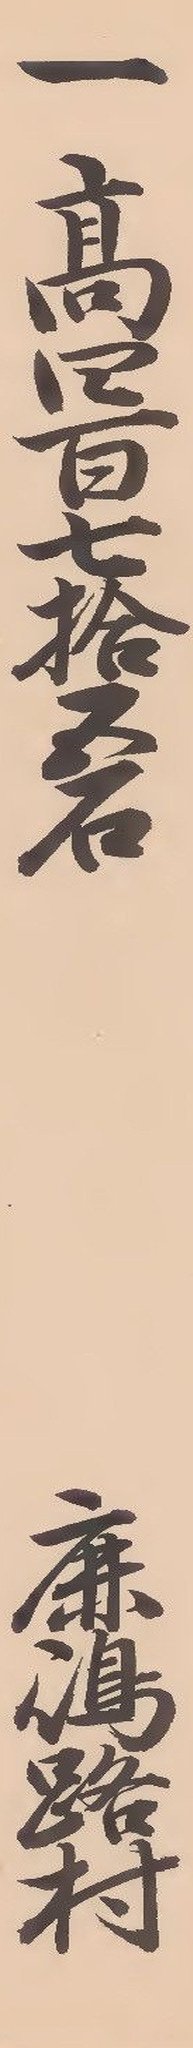一高四百七拾五石鹿島路村
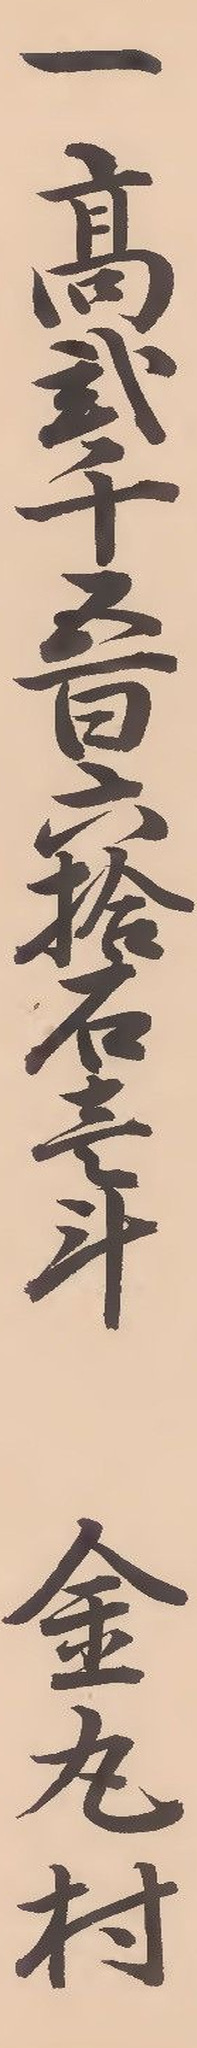一高弐千五百六拾石壱斗金丸村

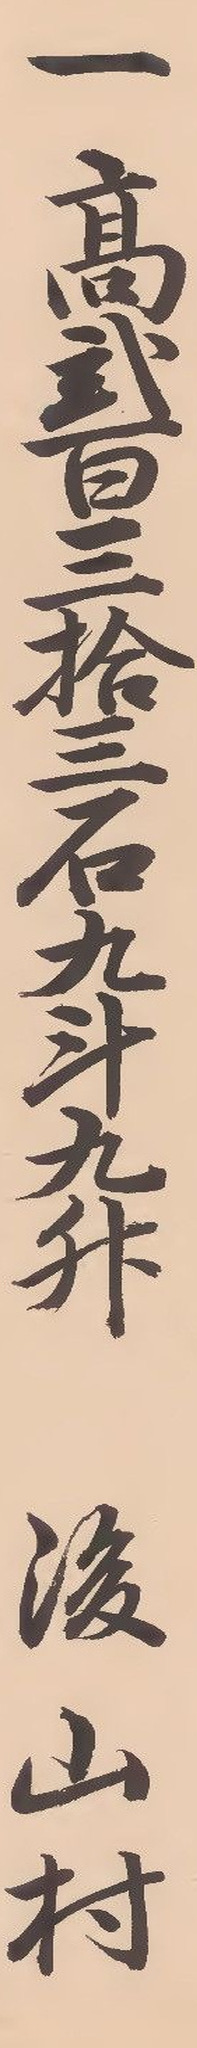一高弐百三拾三石九斗九升後山村
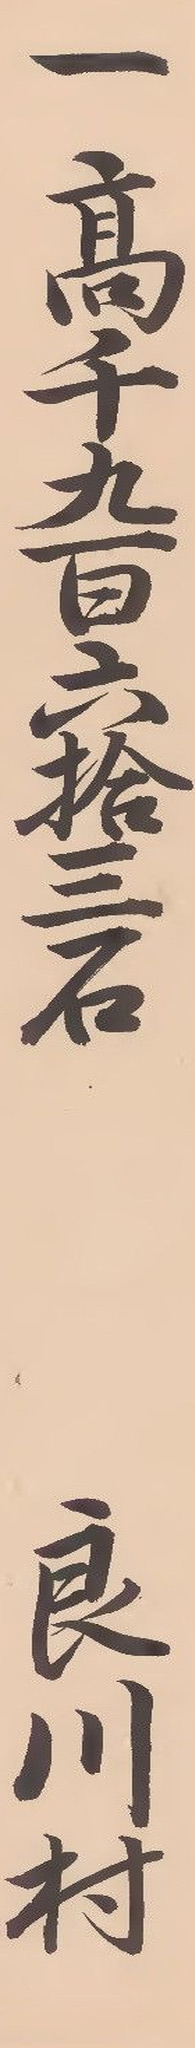一高千九百六拾三石良川村
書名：能登国郷帳
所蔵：国立公文書館 National Archives of Japan
